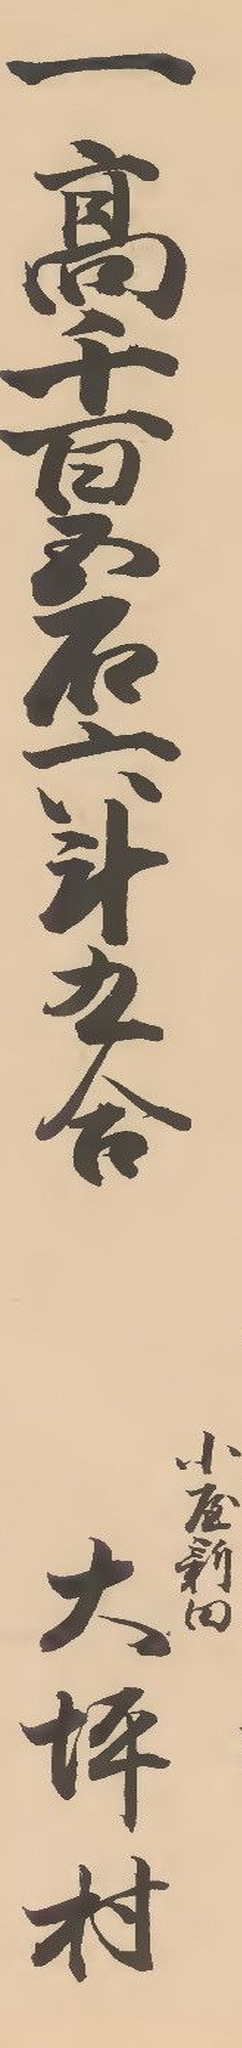一高千百五石六斗九合大坪村
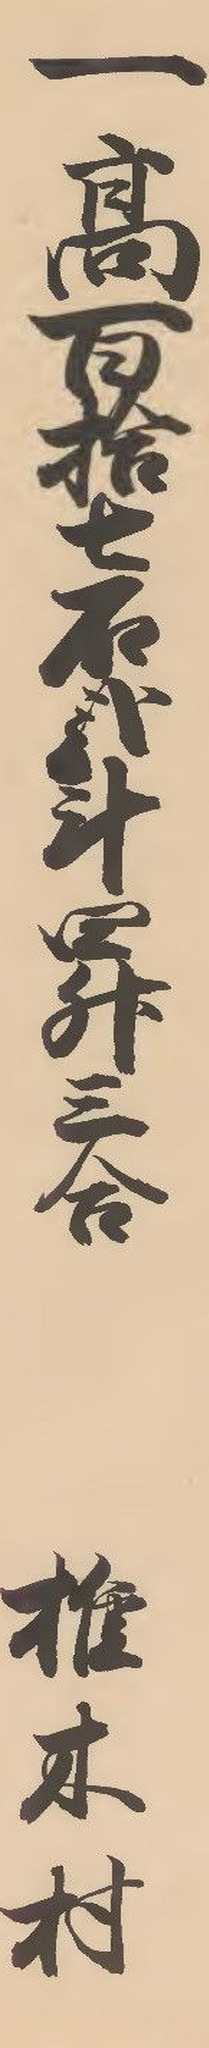一高百拾七石弐斗四升三合椎木村
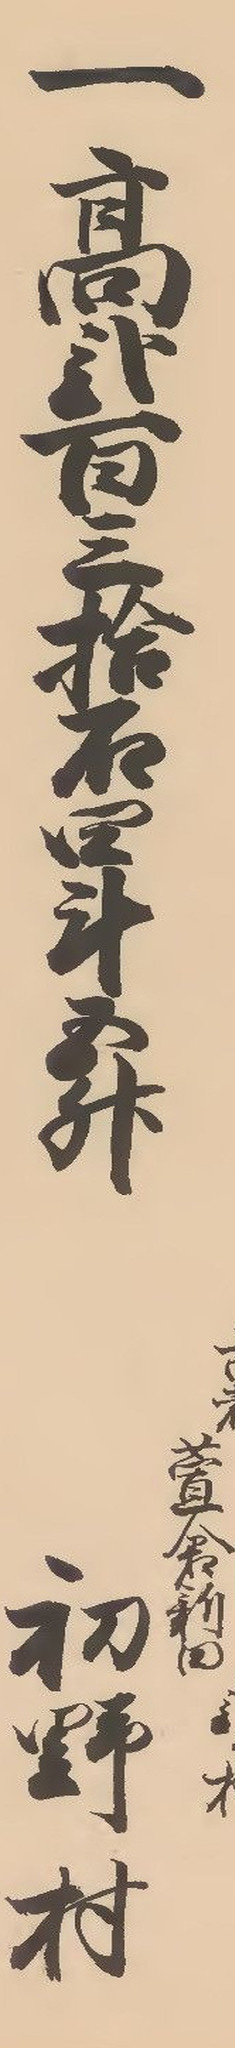一高弐百三拾石四斗五升初野村
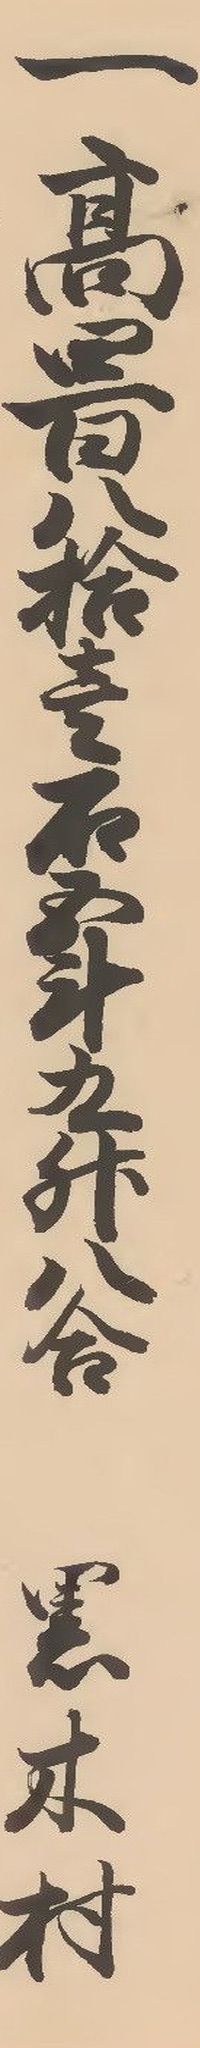一高四百八拾壱石五斗九升八合黒木村
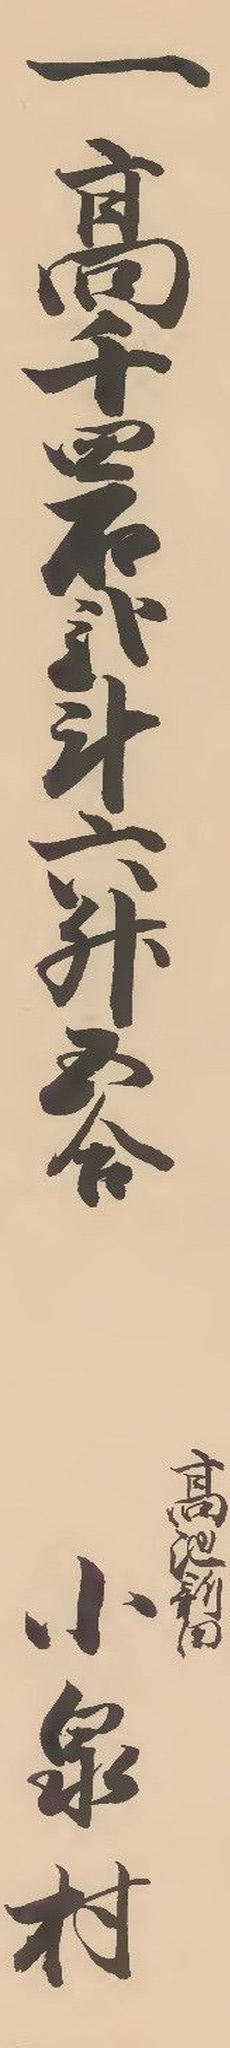一高千四石弐斗六升五合小泉村

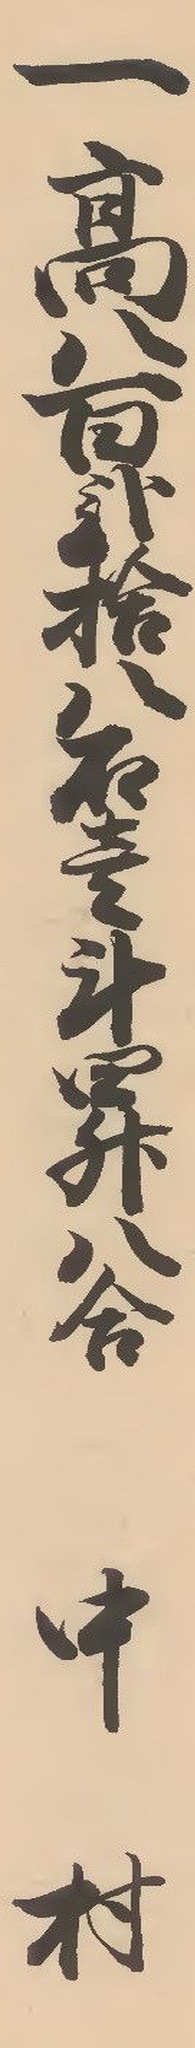一高八百弐拾八石壱斗四升八合中村
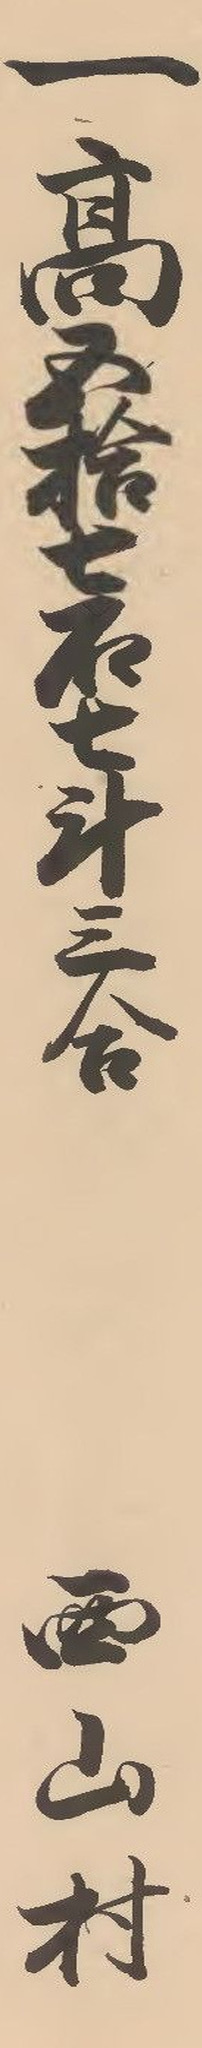一高五拾七石七斗三合西山村
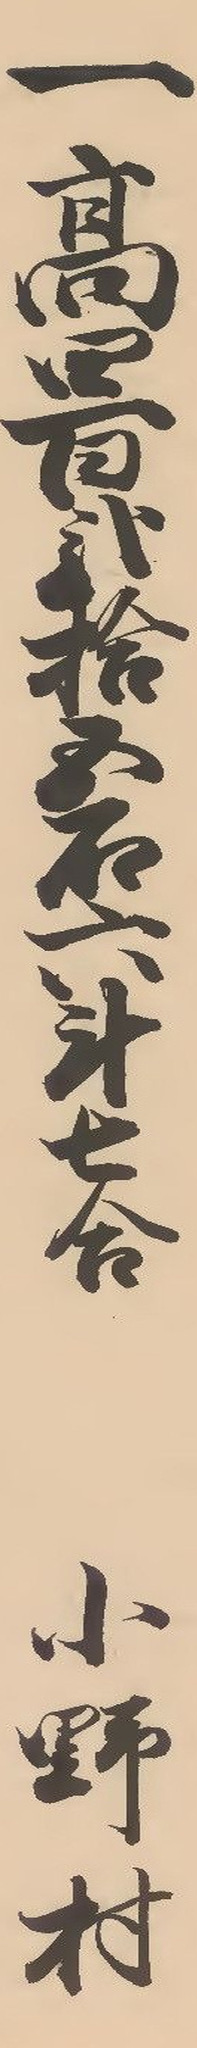一高四百弐拾五石六斗七合小野村
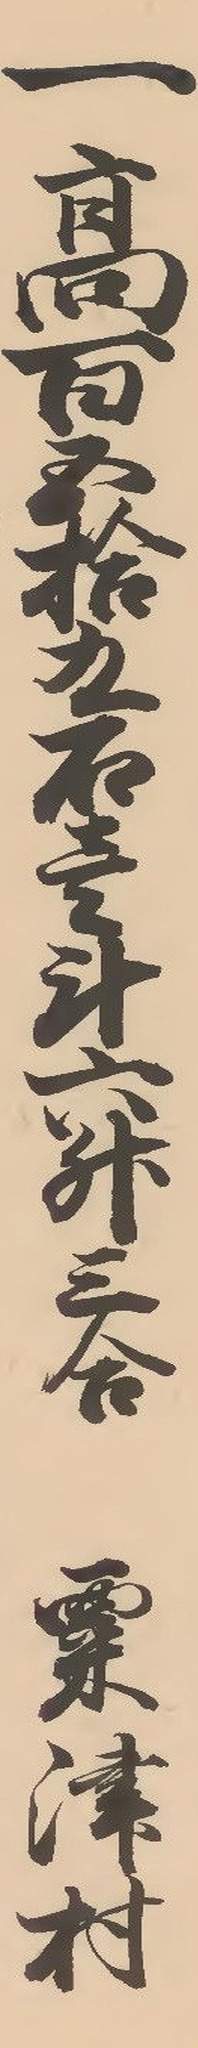一高百五拾九石壱斗六升三合粟津村
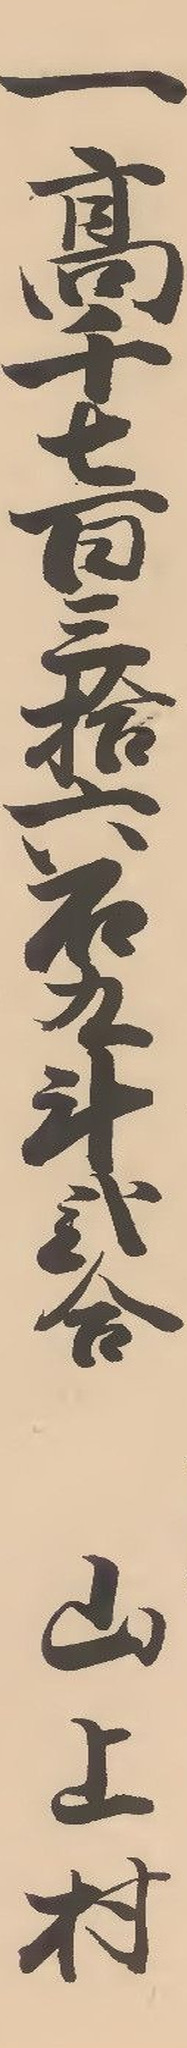一高千七百三拾六石九斗弐合山上村
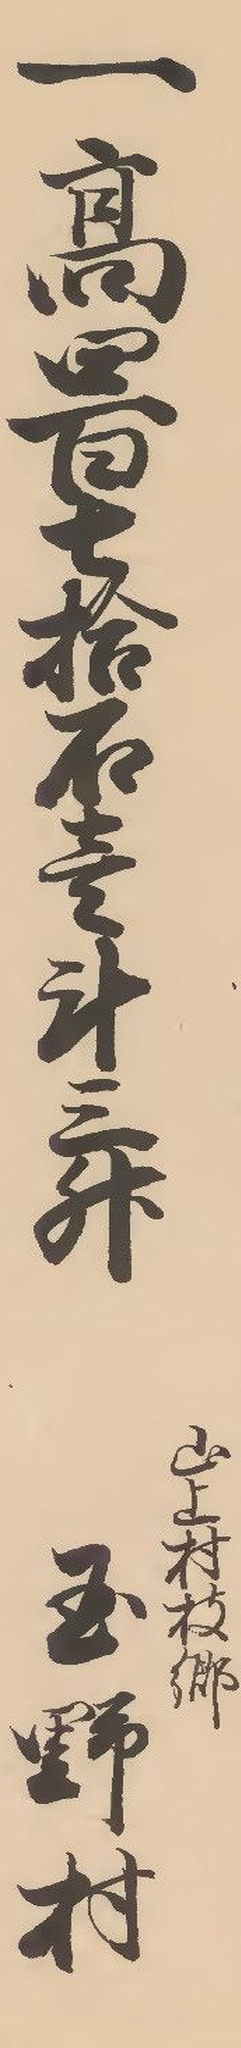一高四百七拾石壱斗三升玉野村
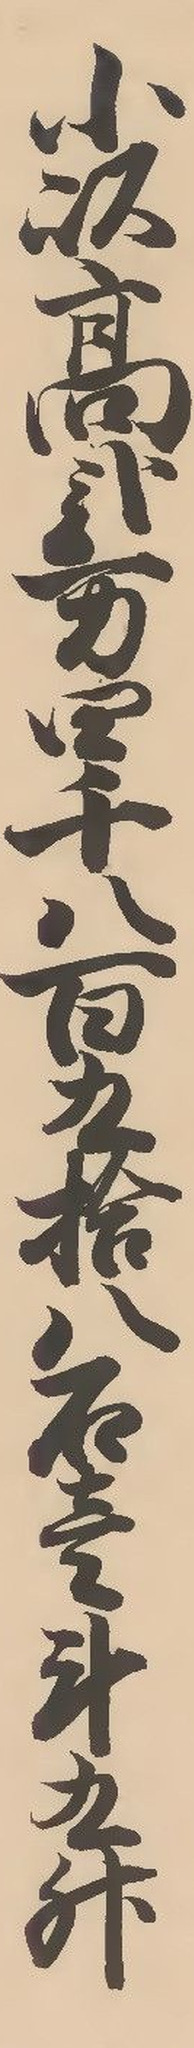小以高弐万四千八百九拾八石壱斗九升

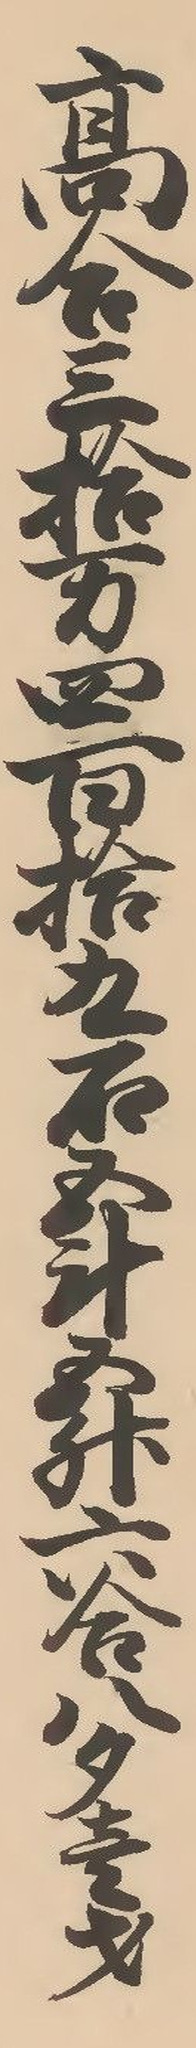高合三拾万四百拾九石五斗五升六合八勺壱才
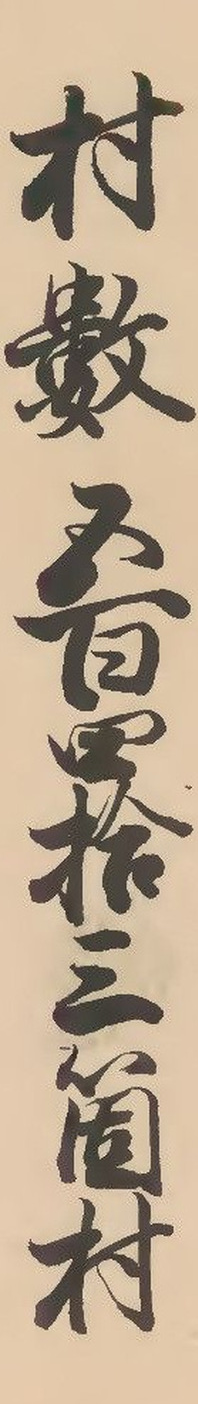村数五百四拾三箇村
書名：陸奥国郷帳　３
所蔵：国立公文書館 National Archives of Japan
